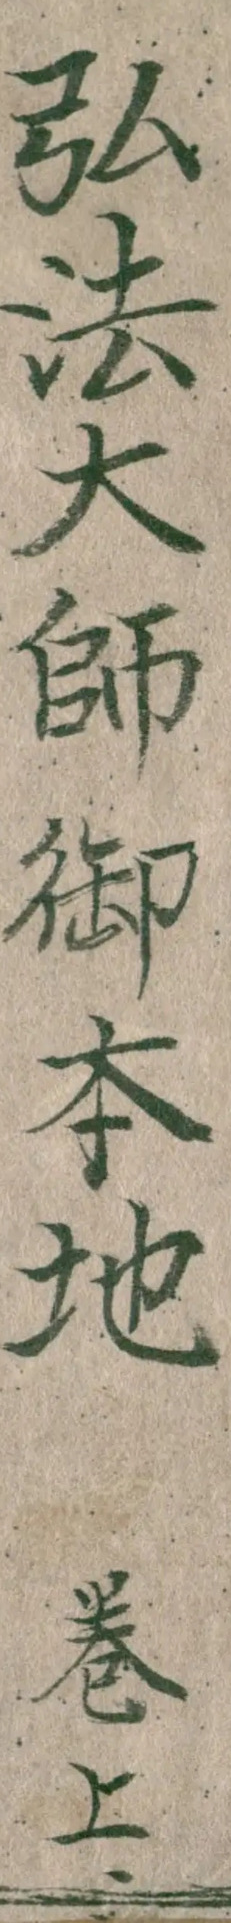弘法大師御本地巻上

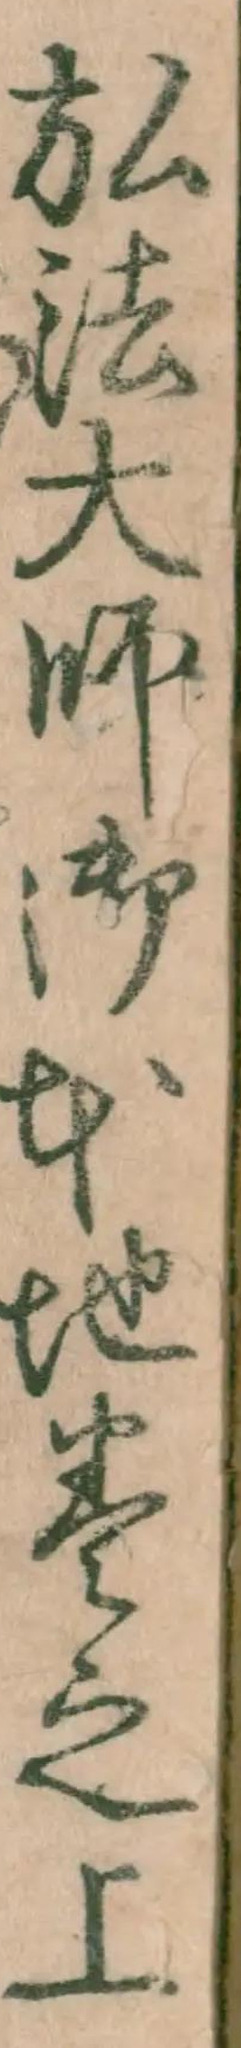弘法大師御本地巻之上
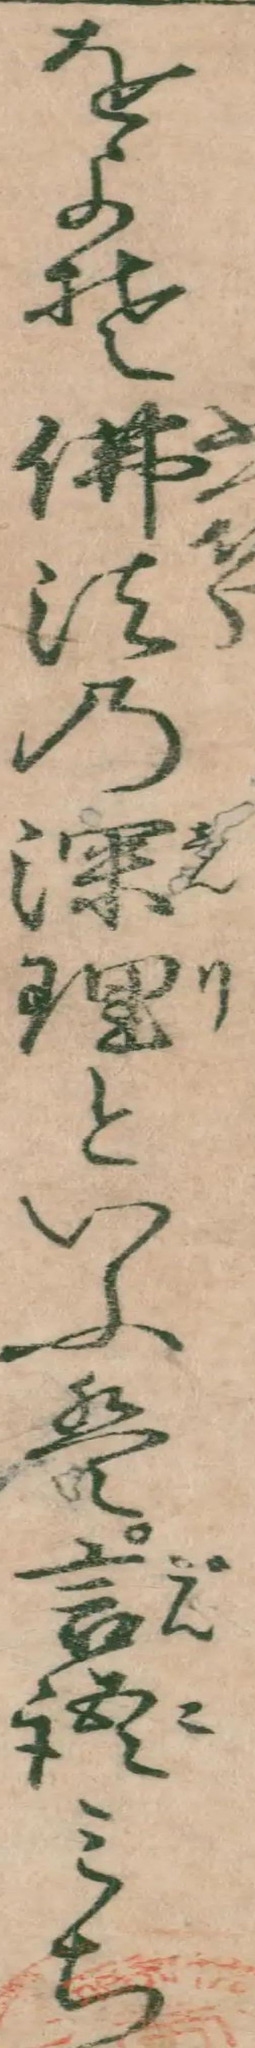をよそ仏法の深理といふは。言語みち
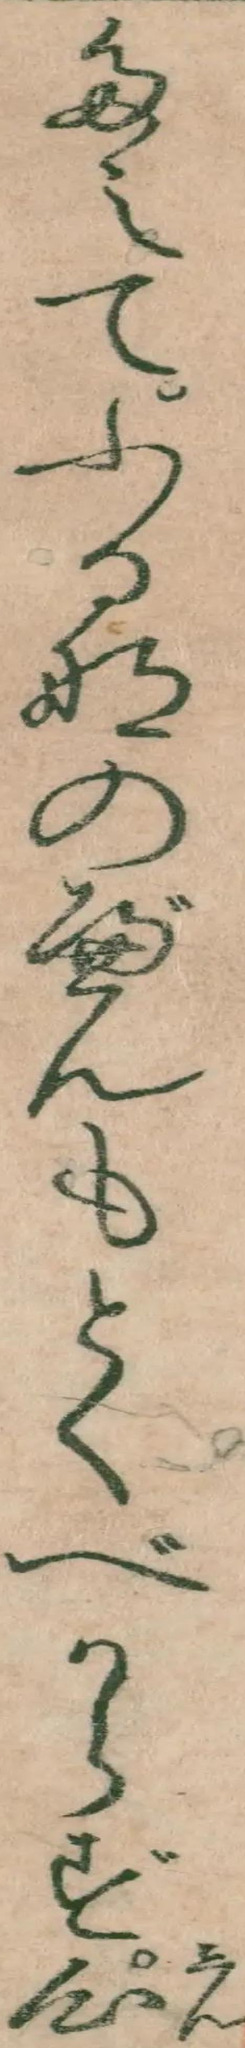たえて。ふるなのべんもとくべからず。心
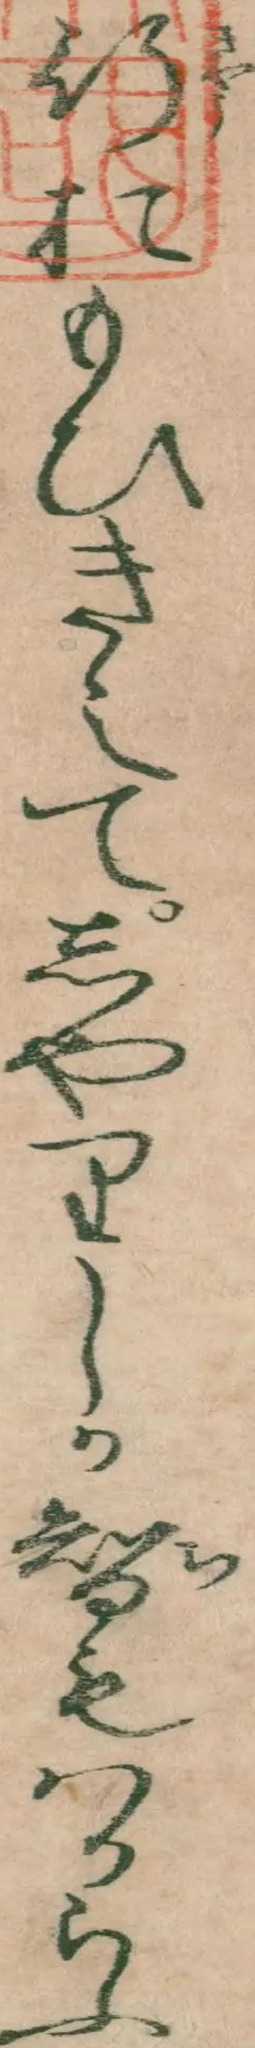行おもひきえて。しやりしか智もはからふ
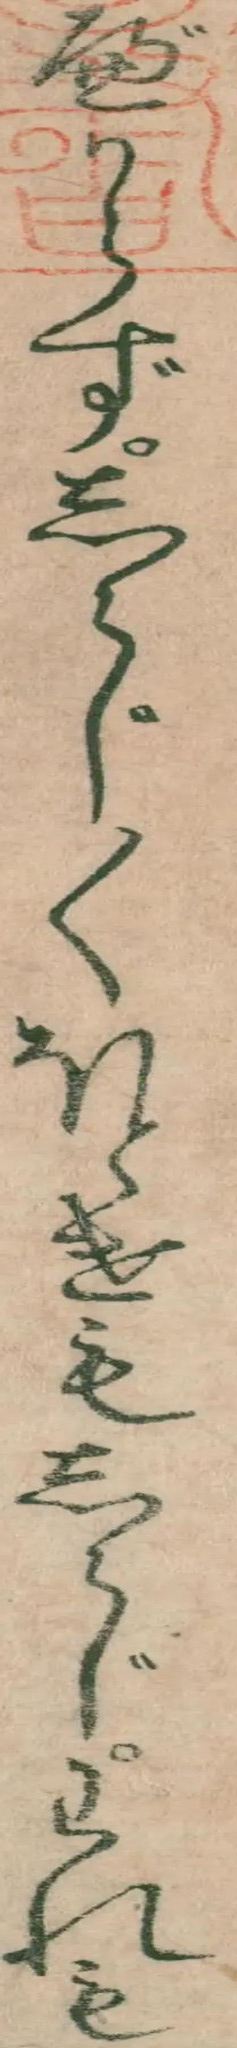べからず。しらじ〳〵ほとけもしらじ。われも
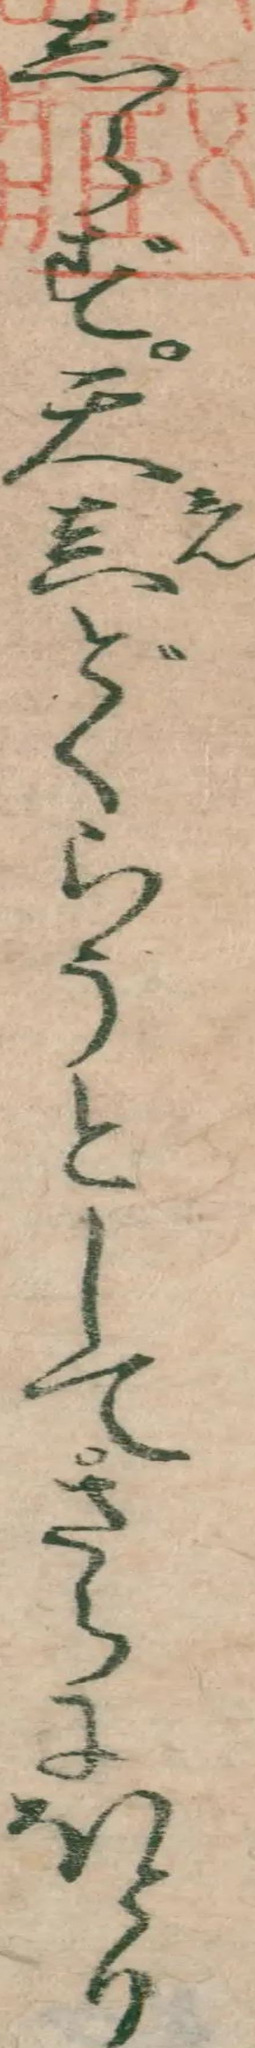しらず。天真どくらうとして。さらにほとり
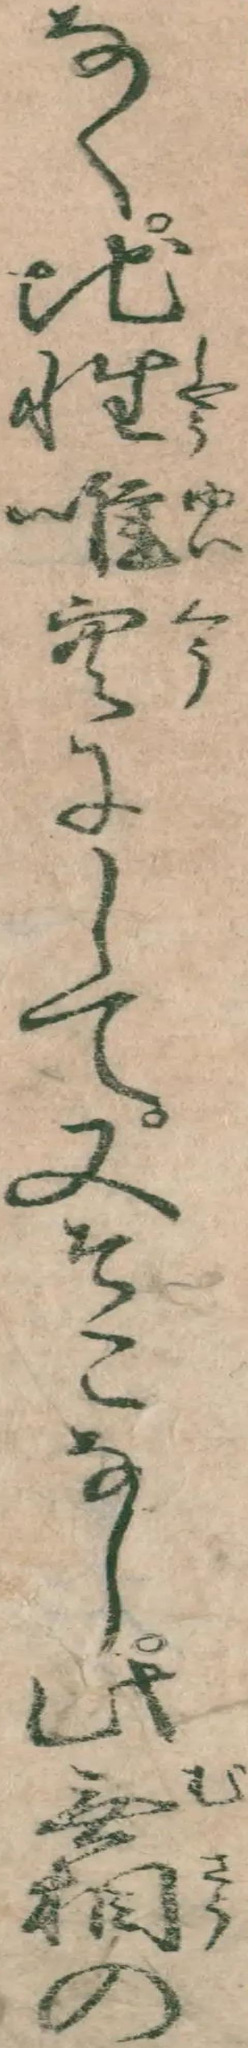なく。地性唯空にして。又そこなし。此無相の
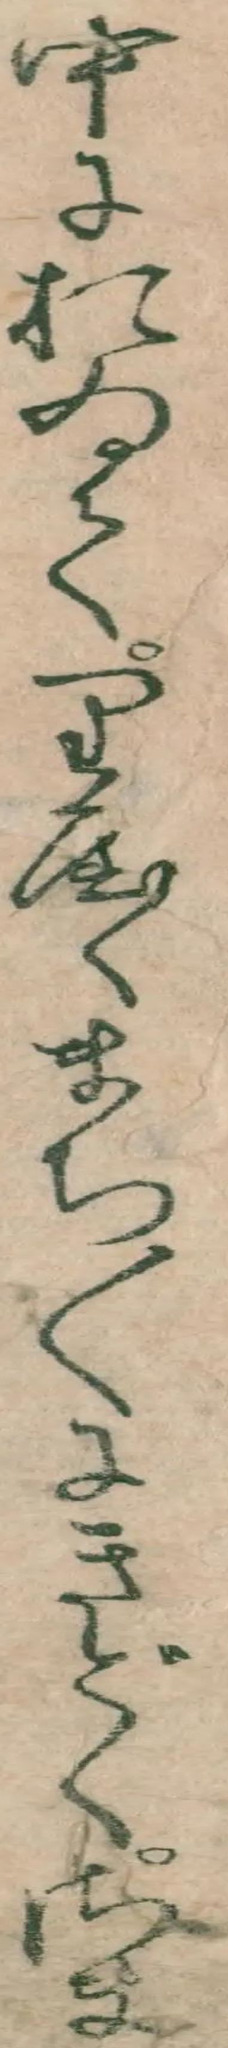中におゐて。りやくまち〳〵にきどく。さま
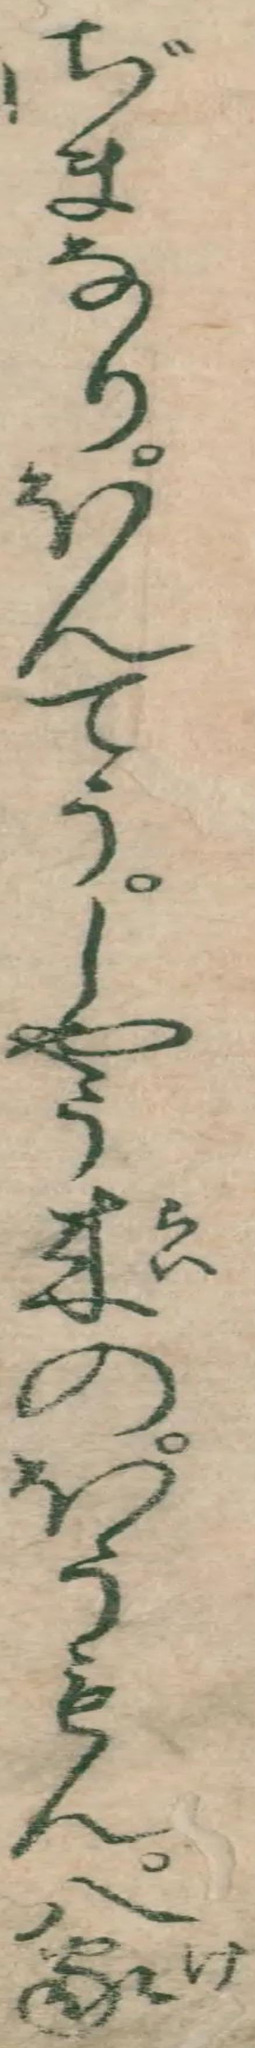ざまなり。ほんてう。しやう来の。ほうもん。八家

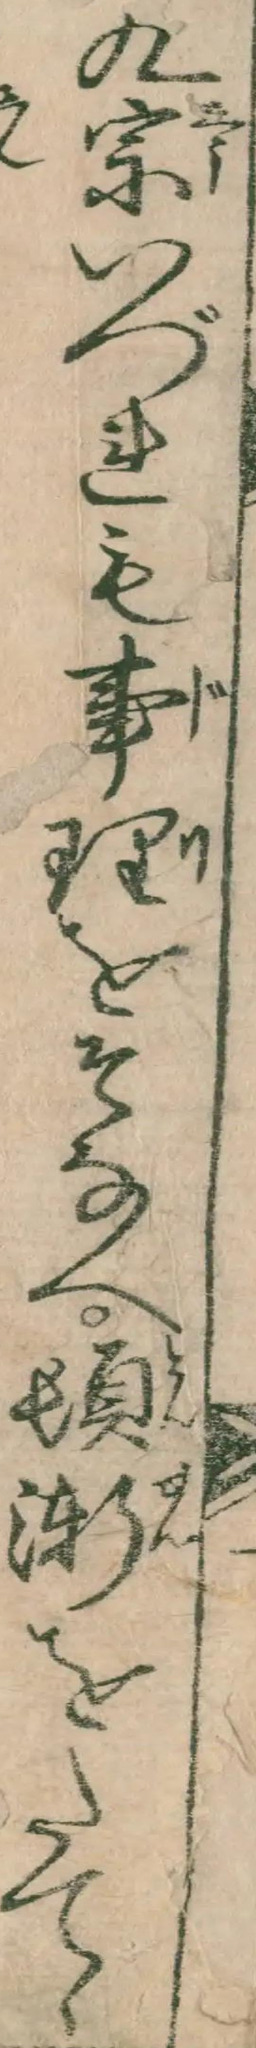九宗いづれも事理をそなへ。頓漸をたてゝ
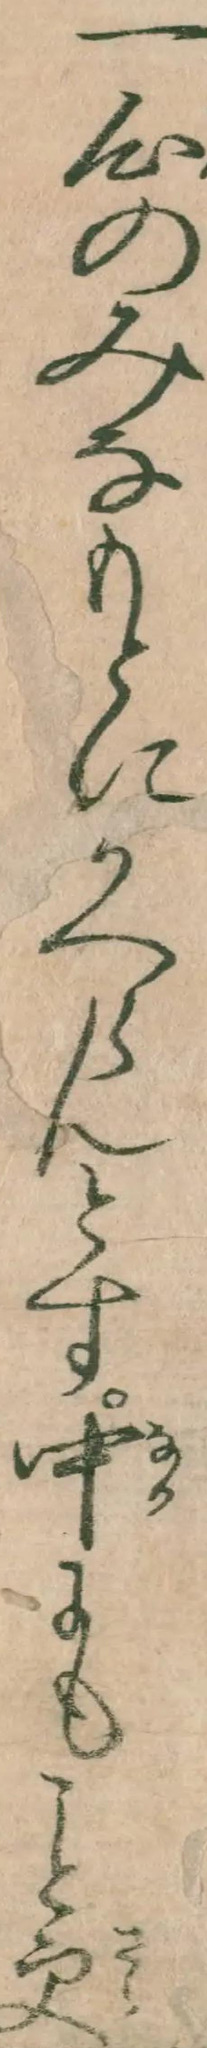一心のみなもとにかへらんとす。中にもこと更
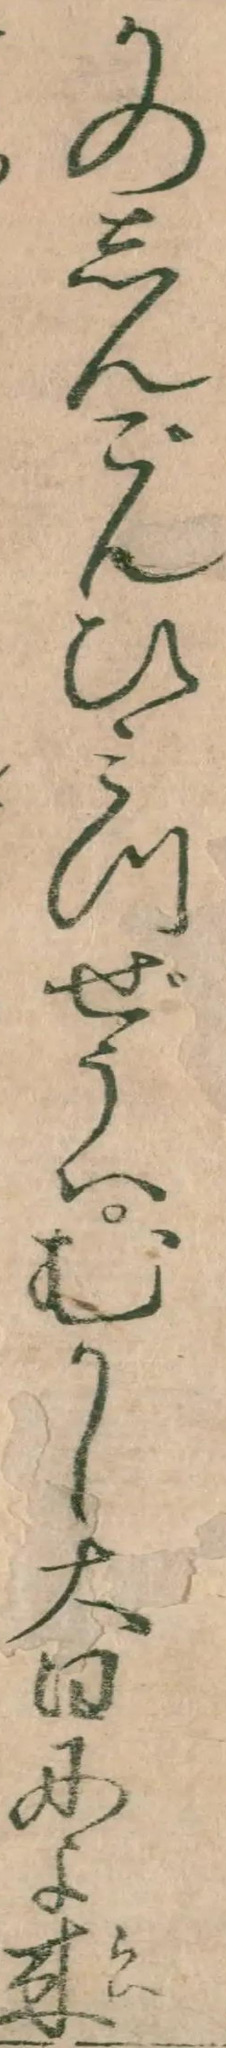かのしんごんひみつぜうは。むかし大日によ来
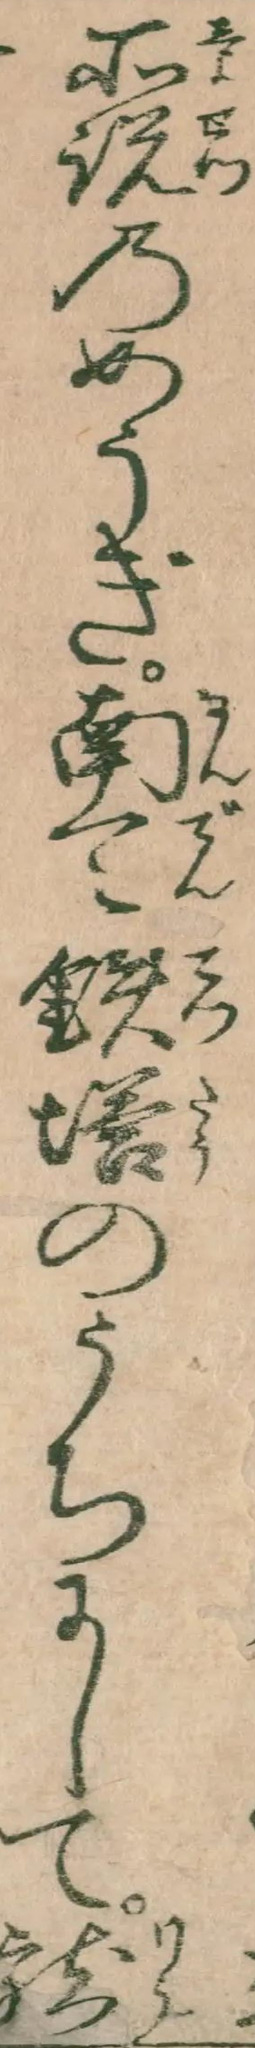所説のめうぎ。南天鉄塔のうちにして。竜
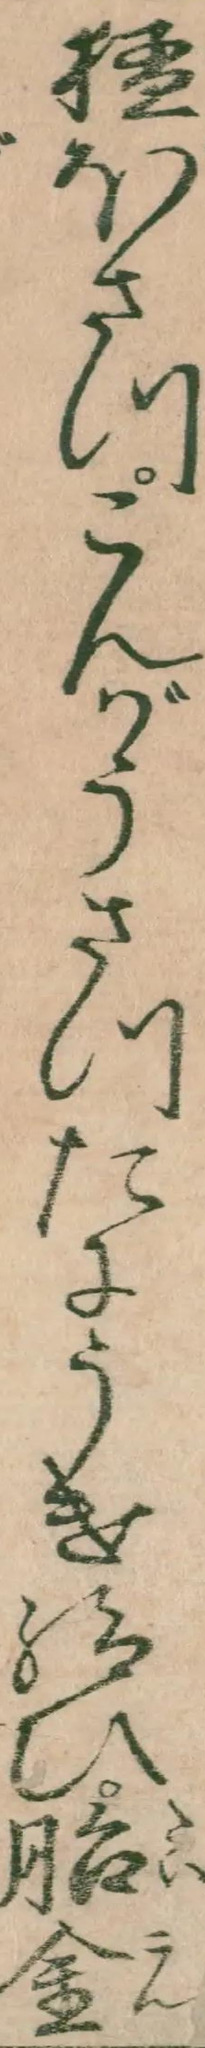猛ぼさつ。こんがうさつたにうけ給ひ。胎金
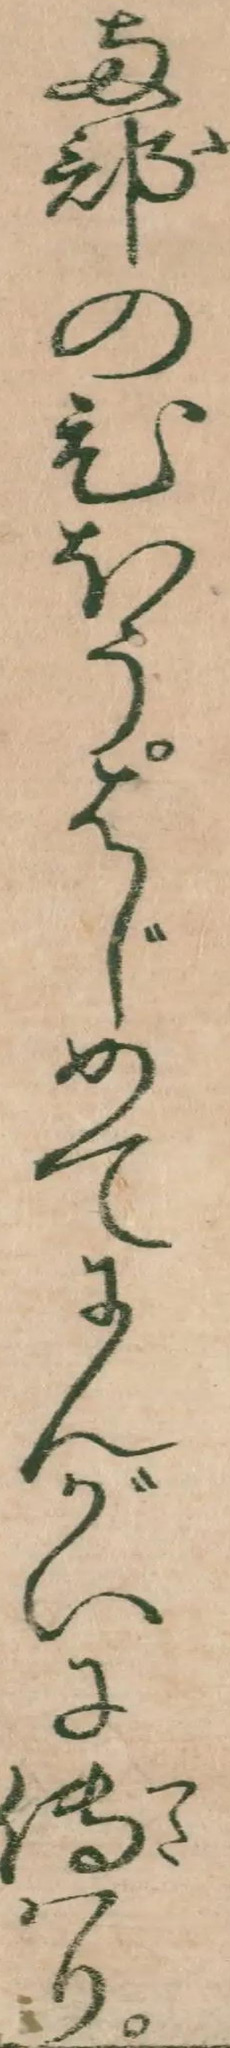両部のひほう。はじめてにんがいに伝はり。
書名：弘法大師御本地 3巻. [1]
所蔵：国立国会図書館 National Diet Library, JAPAN
